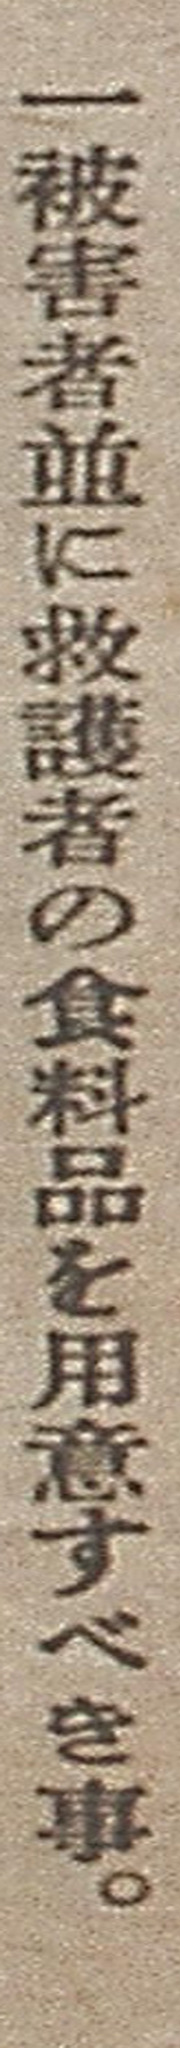一被害者並に救護者の食料品を用意すべき事。
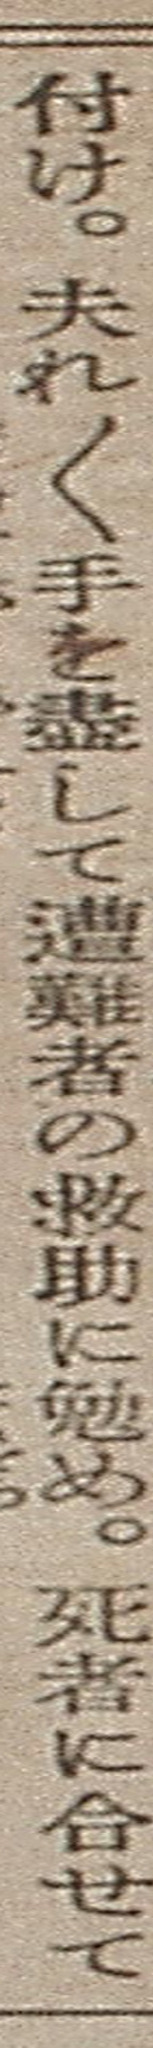付け。夫れ〳〵手を尽して遭難者の救助に勉め。死者に合せて
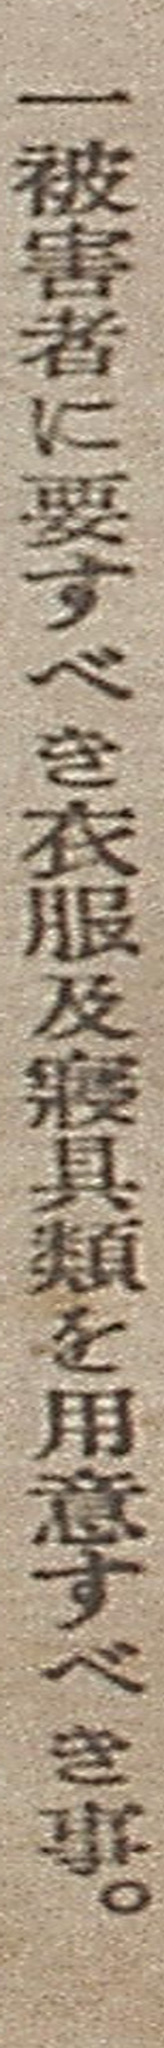一被害者に要すべき衣服及寝具類を用意すべき事。
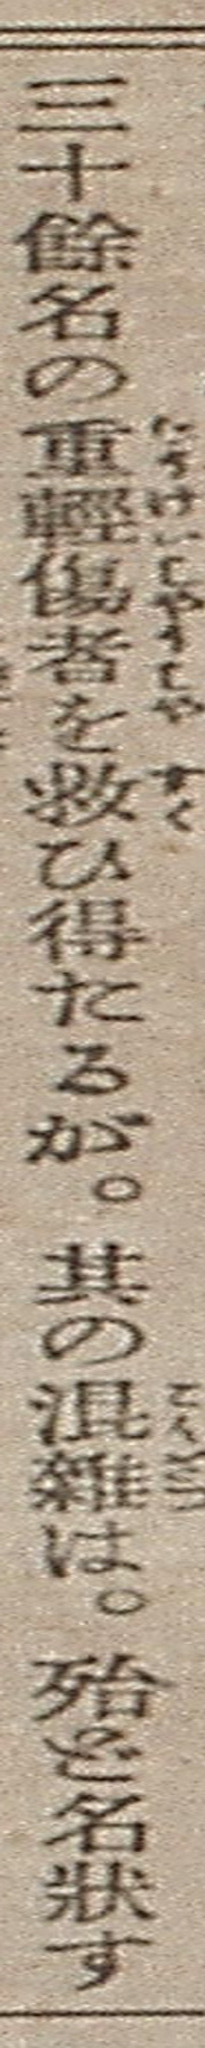三十余名の重軽傷者を救ひ得たるが。其の混雑は。殆ど名状す
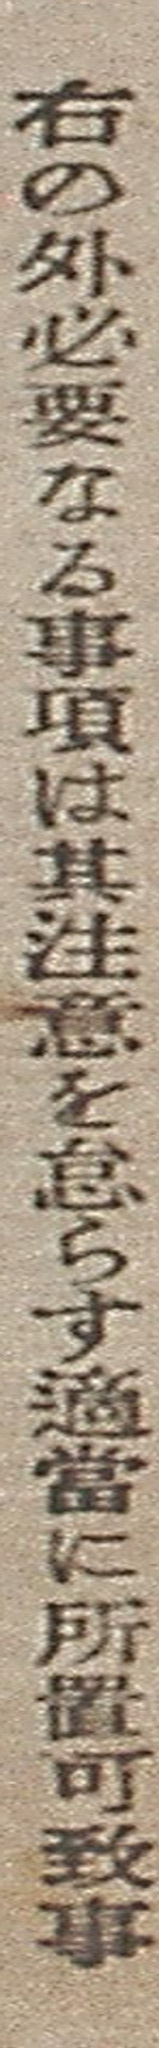右の外必要なる事項は其注意を怠らす適当に所置可致事
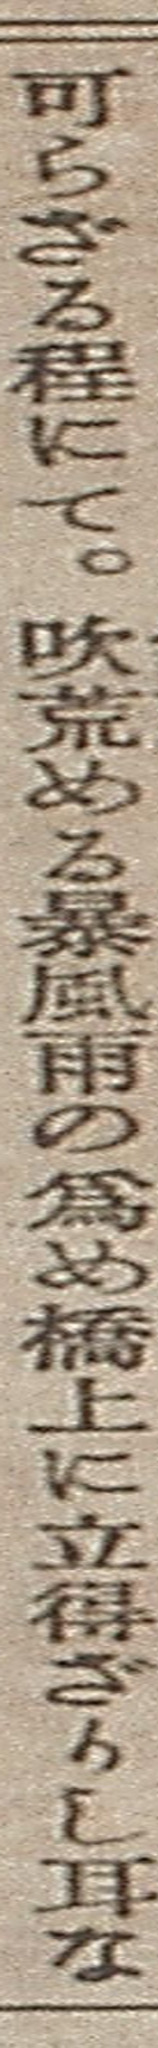可らざる程にて。吹荒める暴風雨の為め橋上に立得ざりし耳な
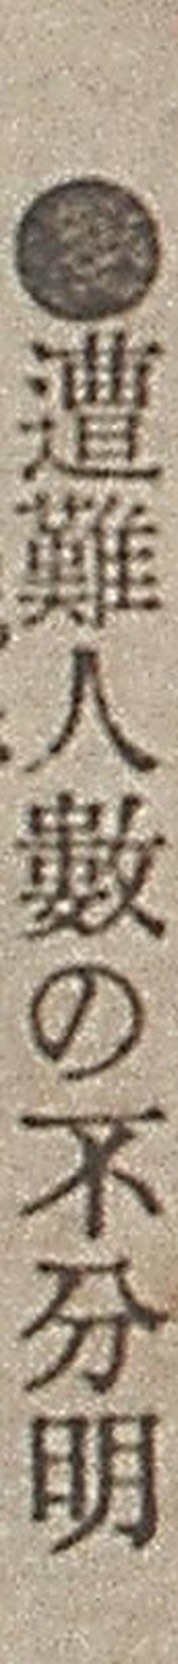●遭難人数の不分明
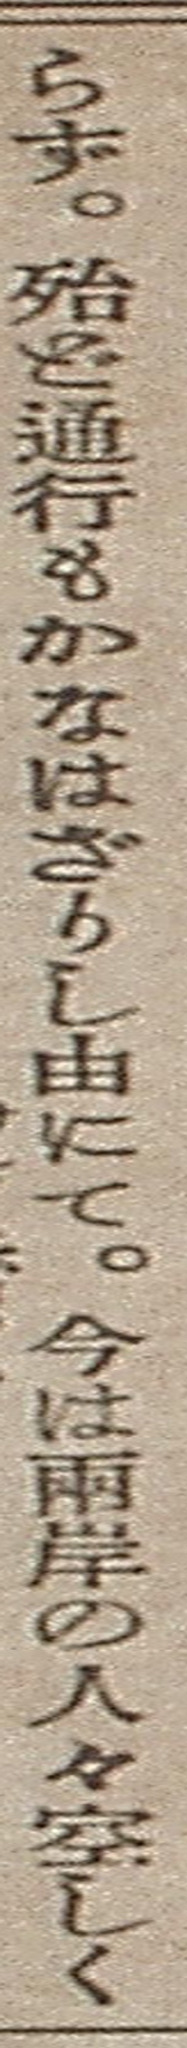らず。殆ど通行もかなはざりし由にて。今は両岸の人々空しく
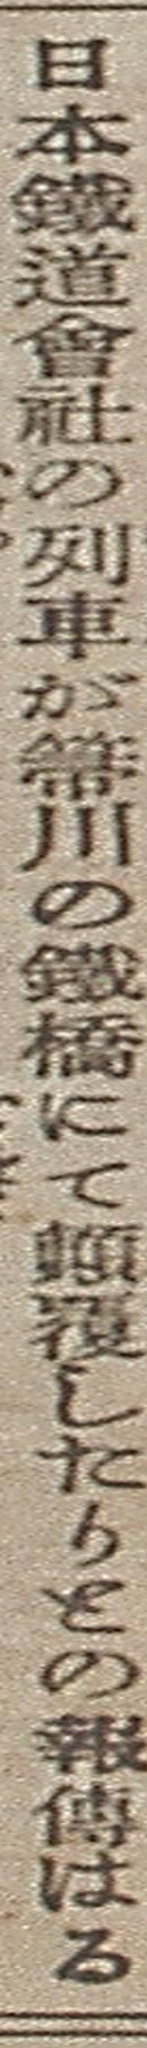日本鉄道会社の列車が箒川の鉄橋にて顛覆したりとの報伝はる
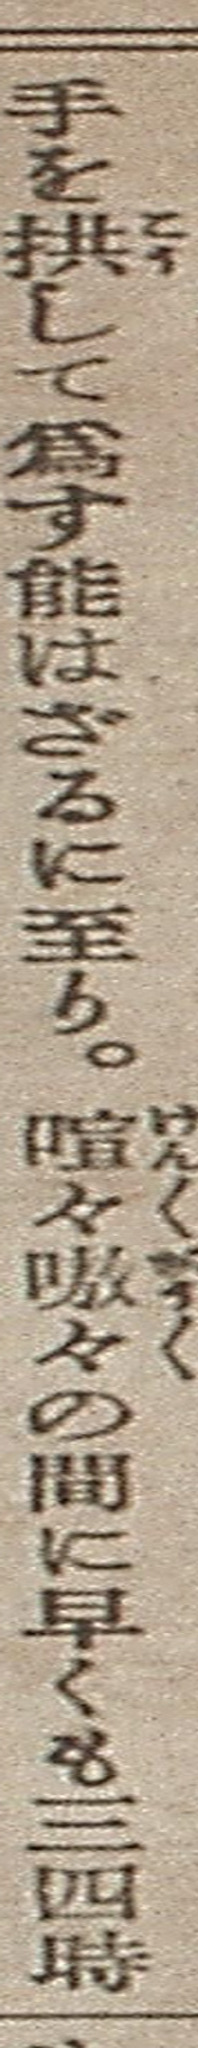手を拱して為す能はざるに至り。喧々嗷々の間に早くも三四時
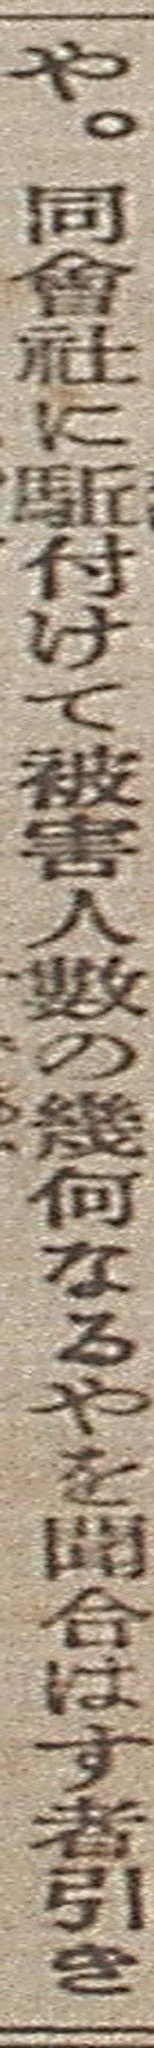や。同会社に駈付けて被害人数の幾何なるやを問合はす者引き
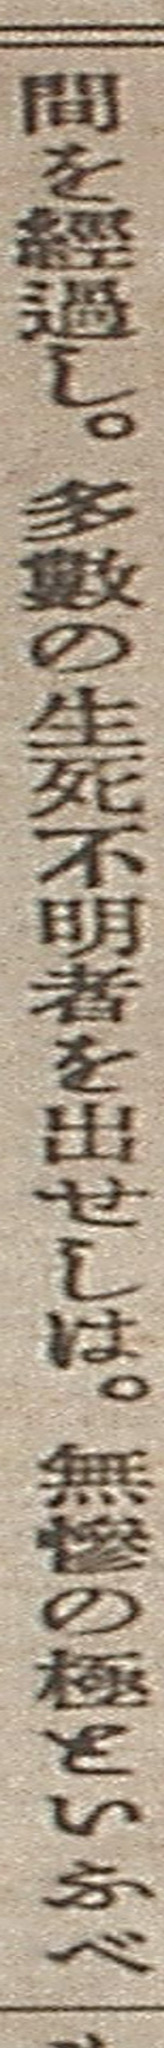間を経過し。多数の生死不明者を出せしは。無惨の極といふべ
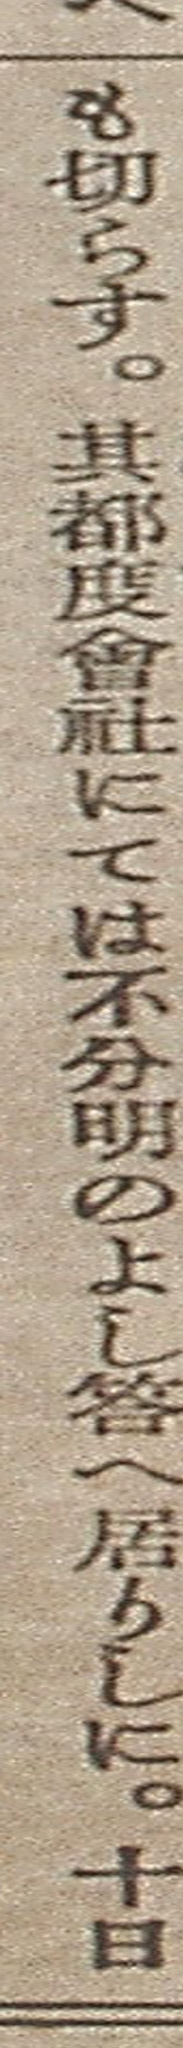も切らす。其都度会社にては不分明のよし答へ居りしに。十日
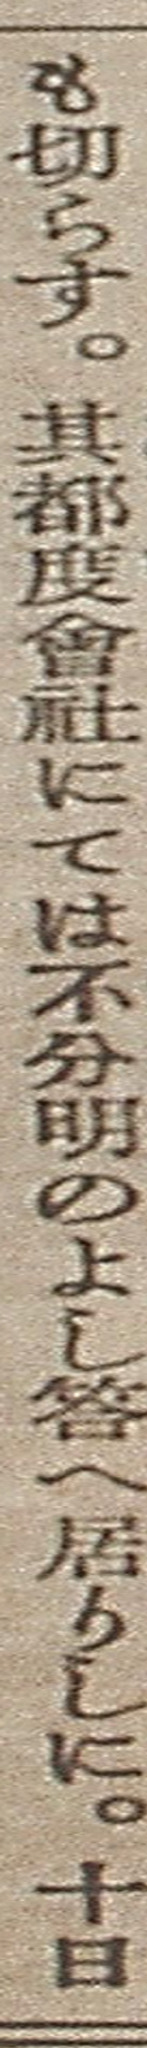も切らす。其都度会社にては不分明のよし答へ居りしに。十日
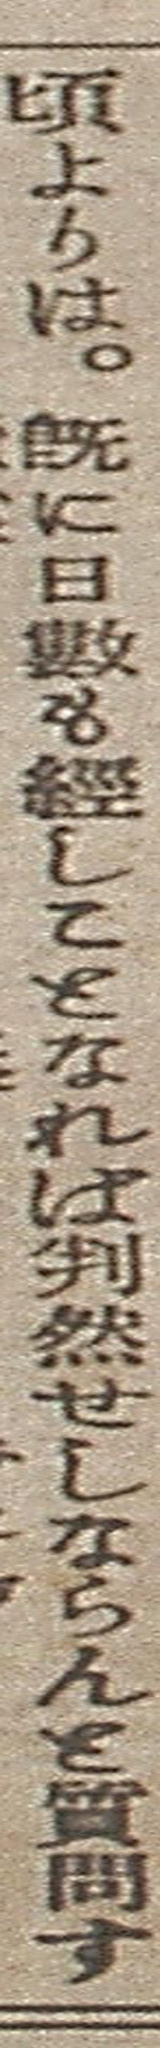頃よりは。既に日数も経しことなれば判然せしならんと質問す
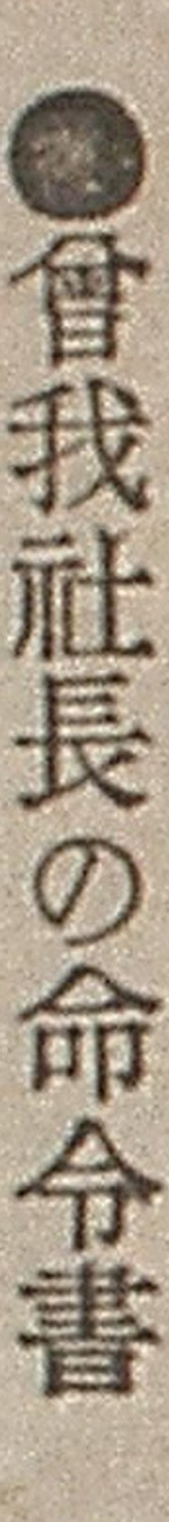●曽我社長の命令書
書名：風俗畫報臨時増刊第百九十九號　明治三十二年十月各地災害圖會（前編之續）
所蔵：東京大学地震研究所図書室 Earthquake Research Institute Library, The University of Tokyo, JAPAN
